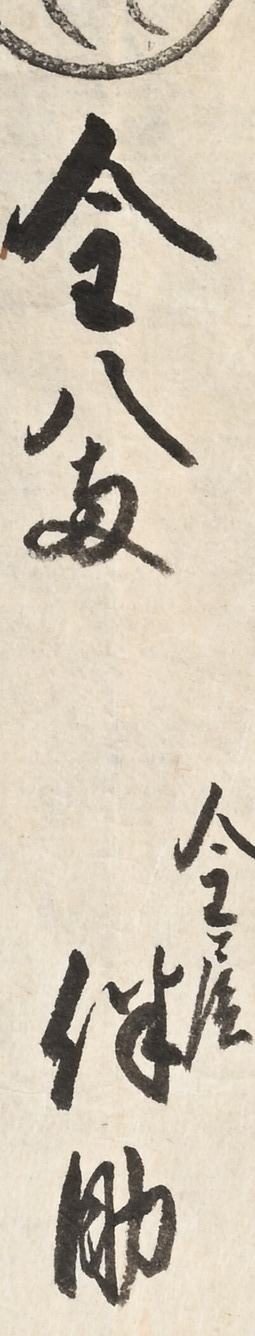金八両伴助
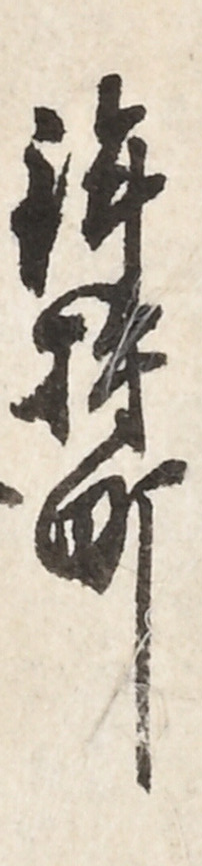鉾持町
